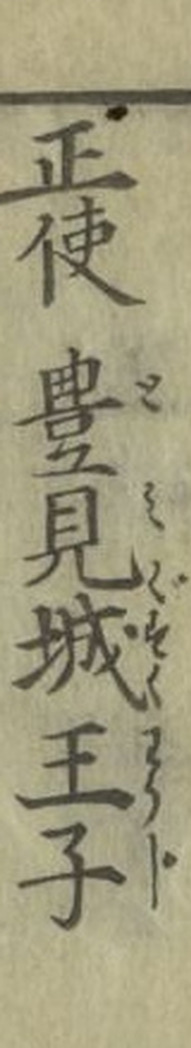正使豊見城王子
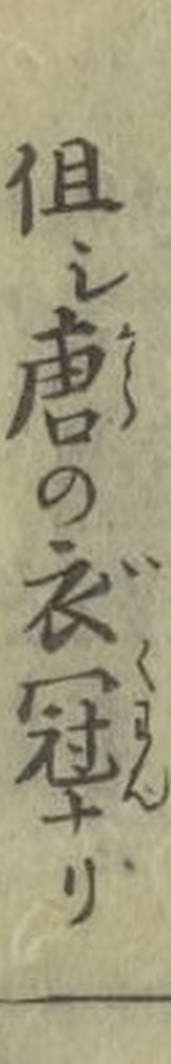但唐の衣冠ナリ
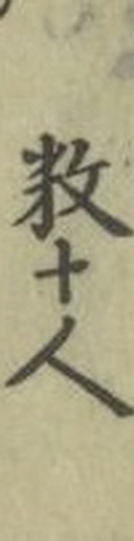数十人
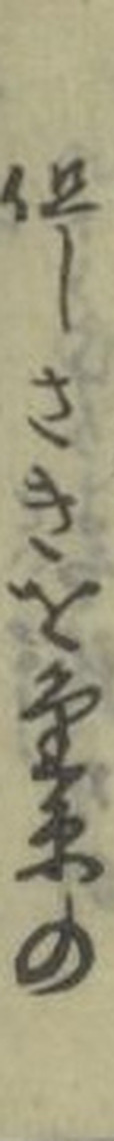但しさきを金糸の
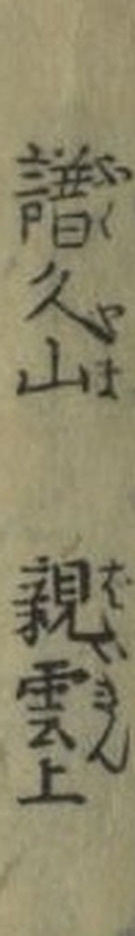譜久山親雲上
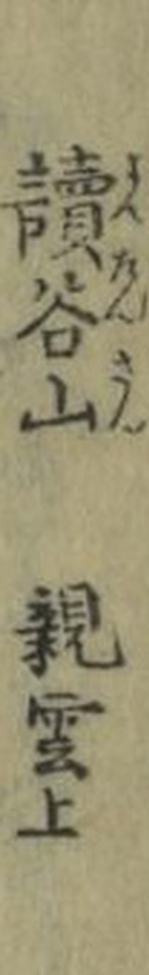讀谷山親雲上
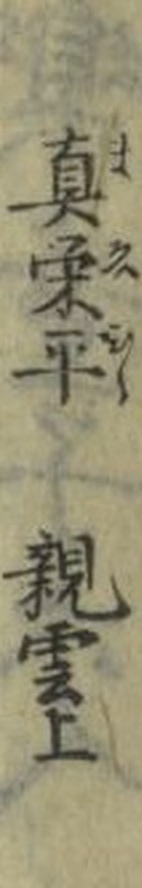真栄平親雲上
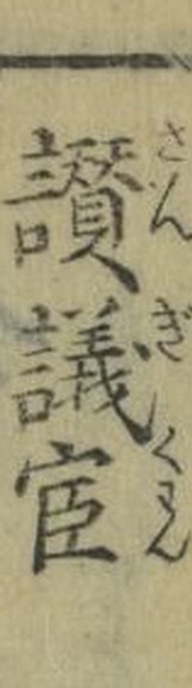讃議宦
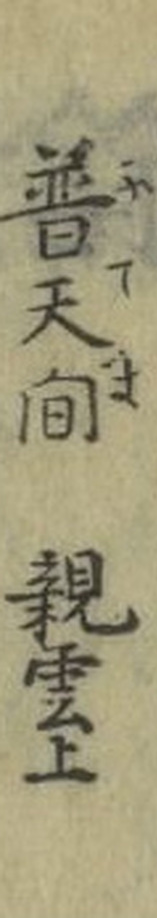普天間親雲上
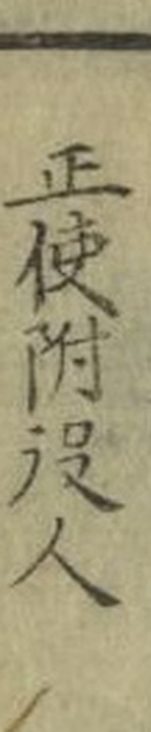正使附従人
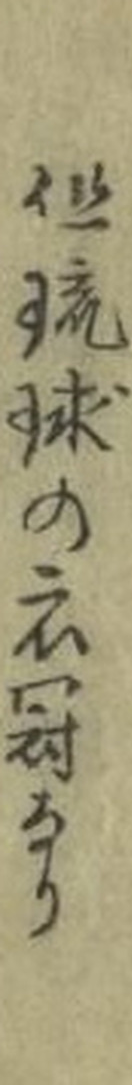但琉球の衣冠なり

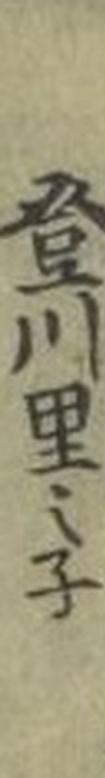登川里之子
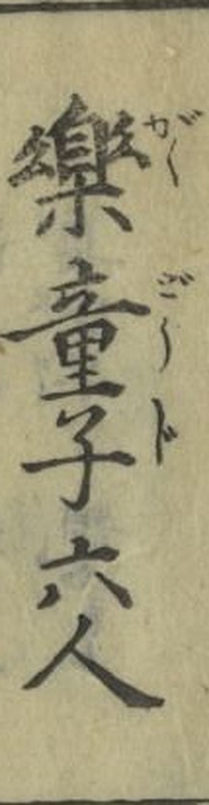樂童子六人
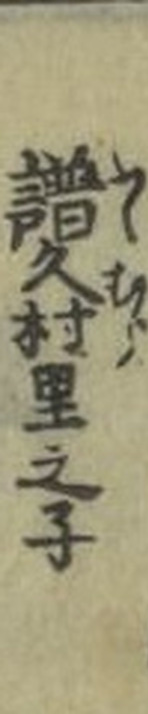譜久村里之子
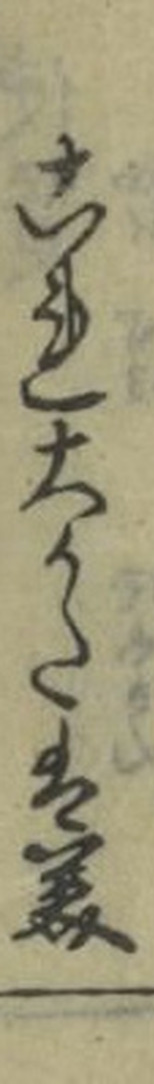これ大かたは美
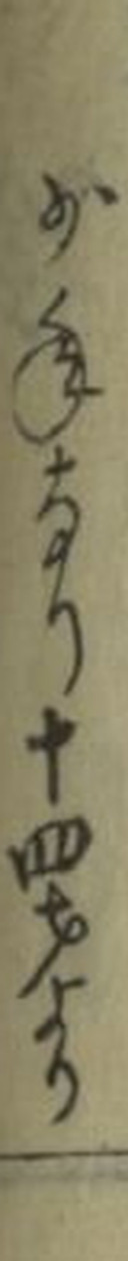少年なり十四才より
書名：新板 琉球人行列記
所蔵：University of the Ryukyus Library
